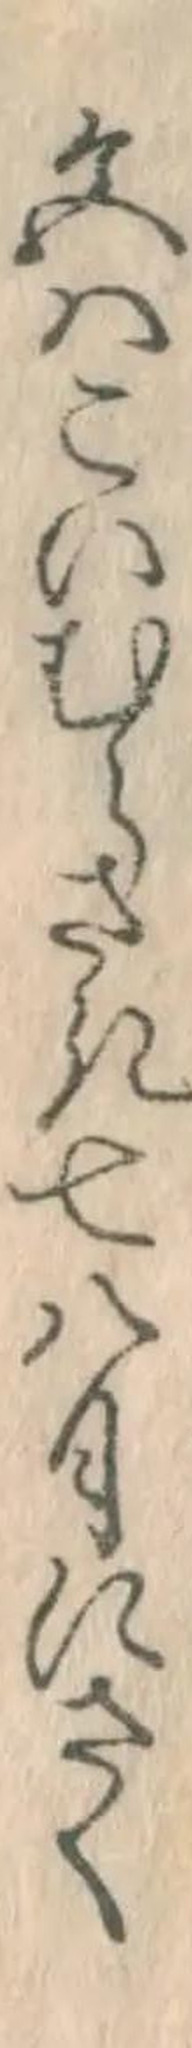色はこいむらさき七八月にさく
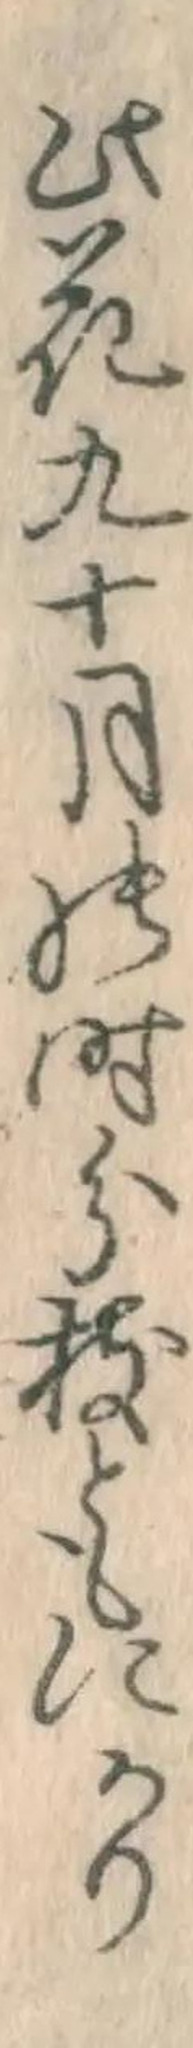此花九十月の時分枝ともにかり
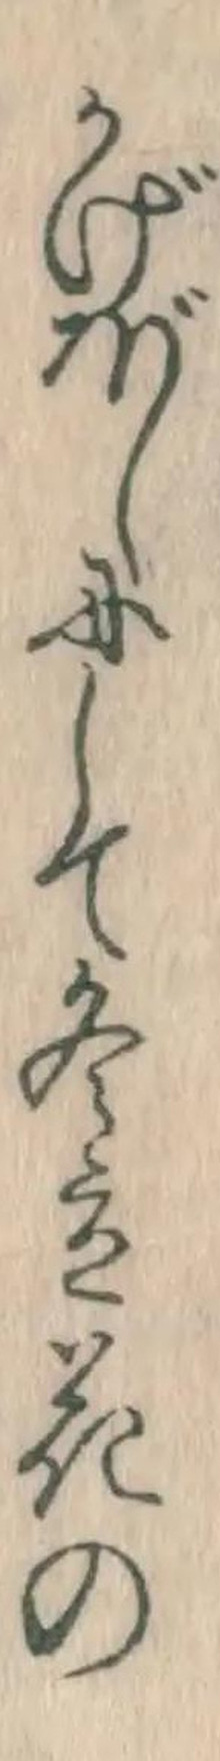かげぼしにして冬立花の
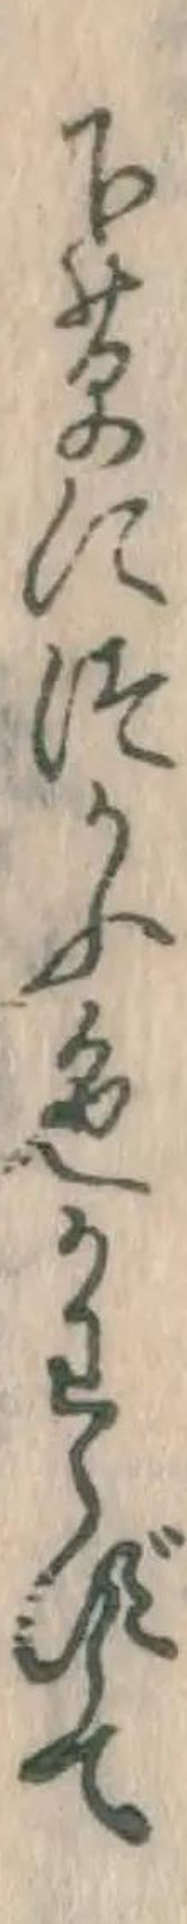下草につかう色かわらずして
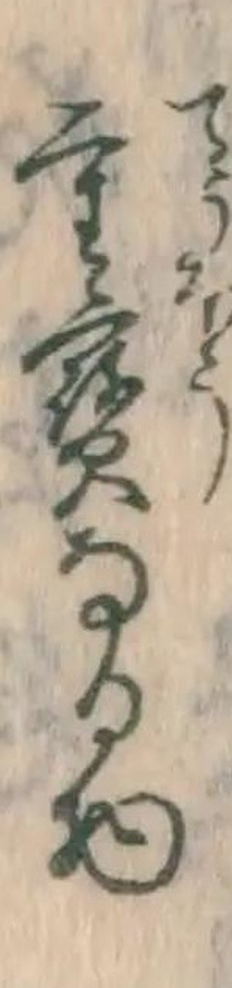重宝なる物
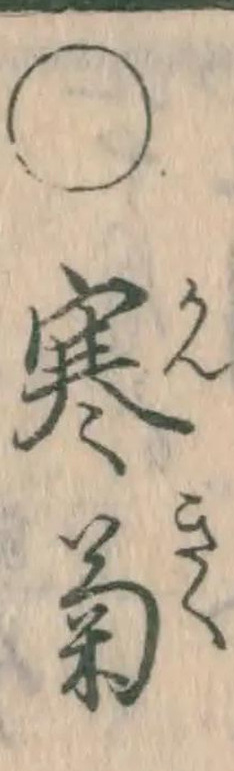〇寒菊
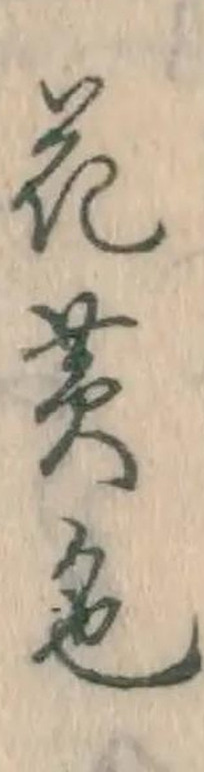花黄色
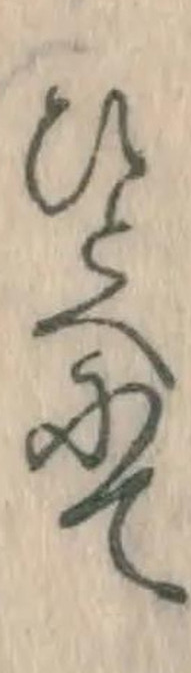ひとへにて
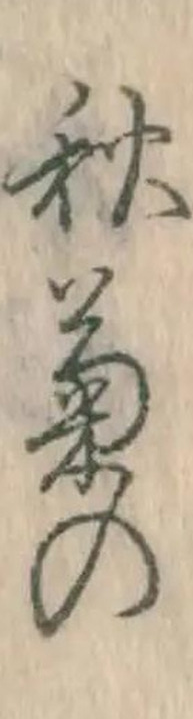秋菊の

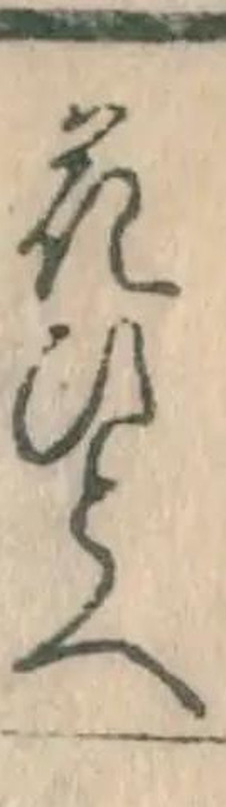花ひとへ
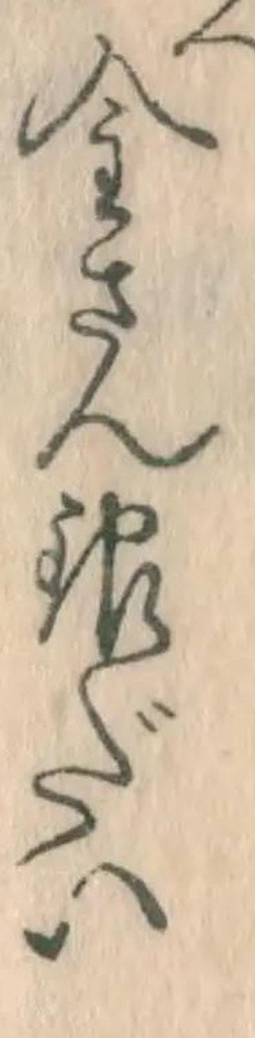金さん銀だい
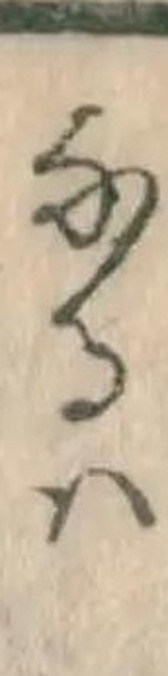なるは
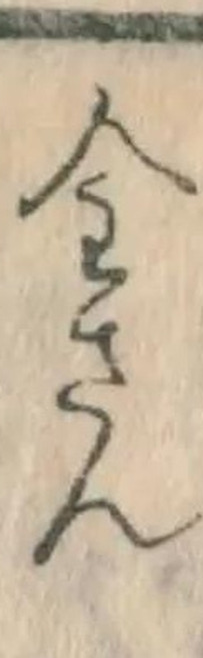金さん
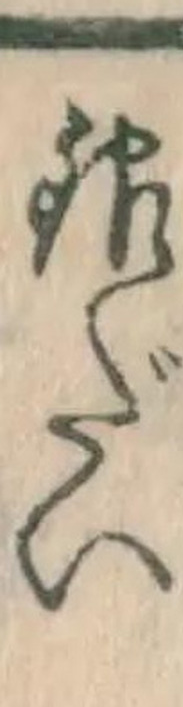銀だい
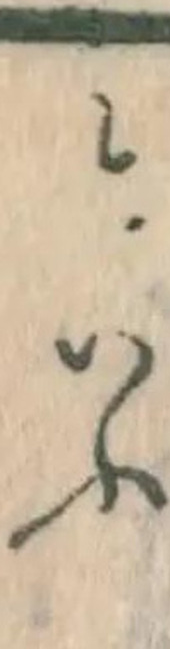といふ
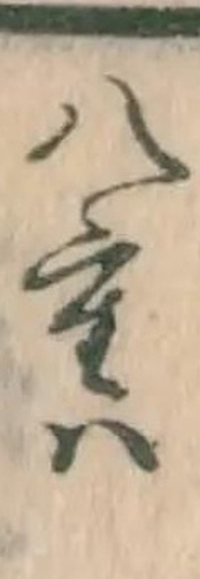八重は
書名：艸花繪前集. [3]
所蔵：国立国会図書館 National Diet Library, JAPAN
